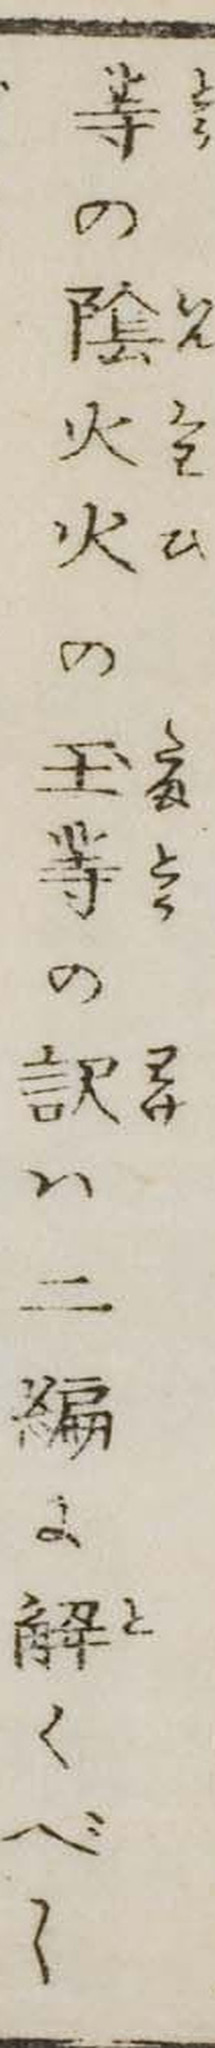等の陰火火の玉等の訳は二編に解くべし
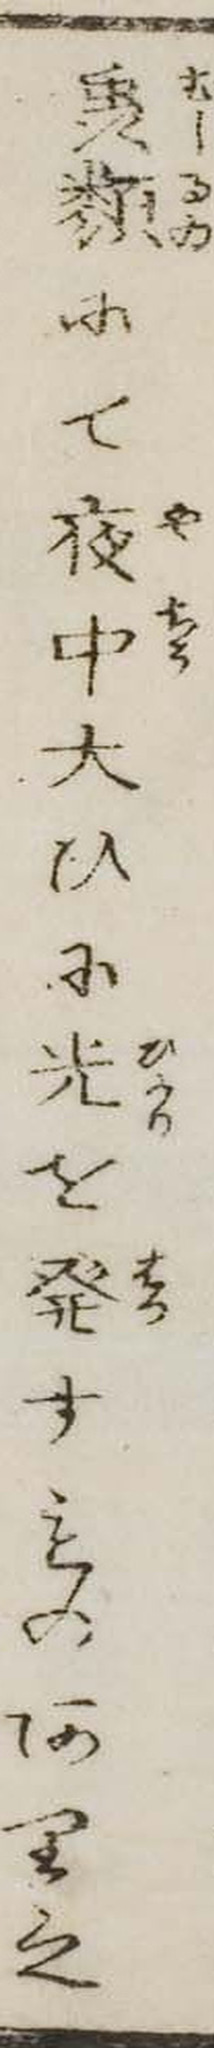蟲類にて夜中大ひに光を発すものあり之
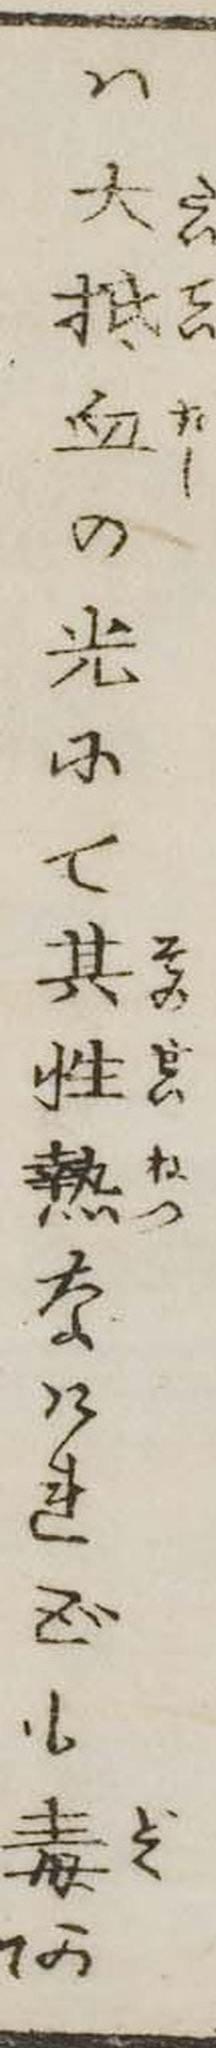は大抵血の光にて其性熱なけれども毒あ
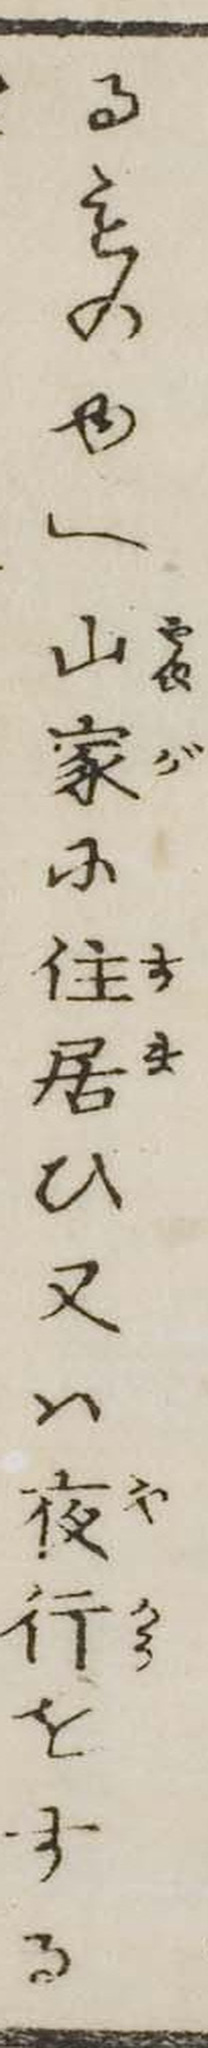るものゆへ山家に住居ひ又は夜行をする
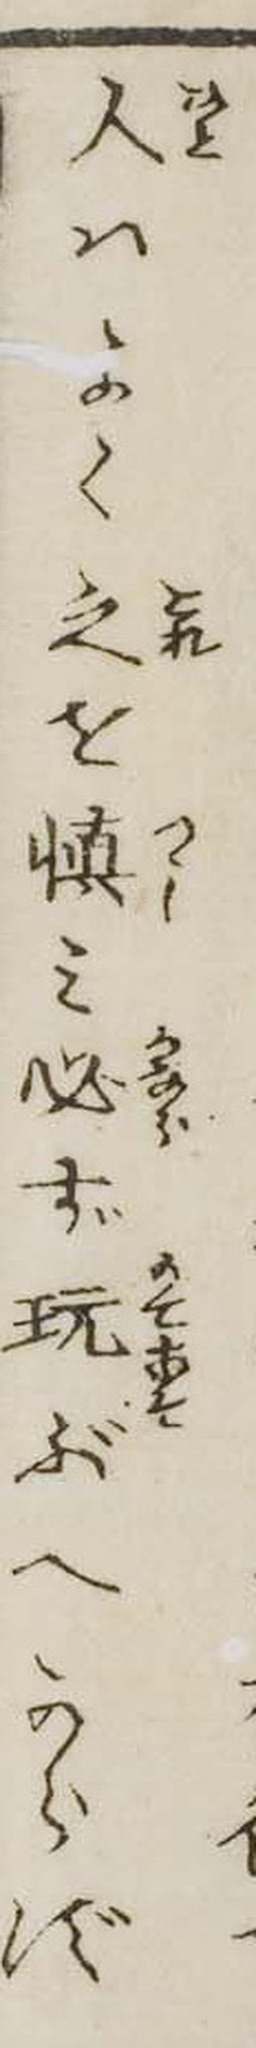人はよく之を慎み必ず玩ぶへからず
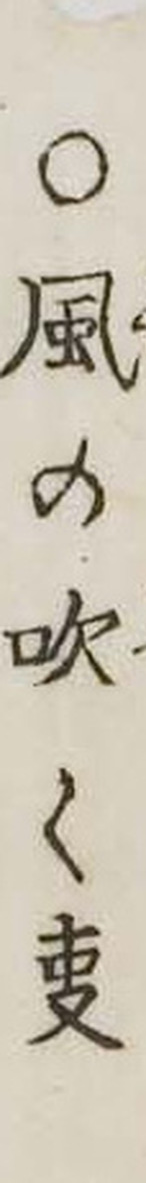◯風の吹く叓
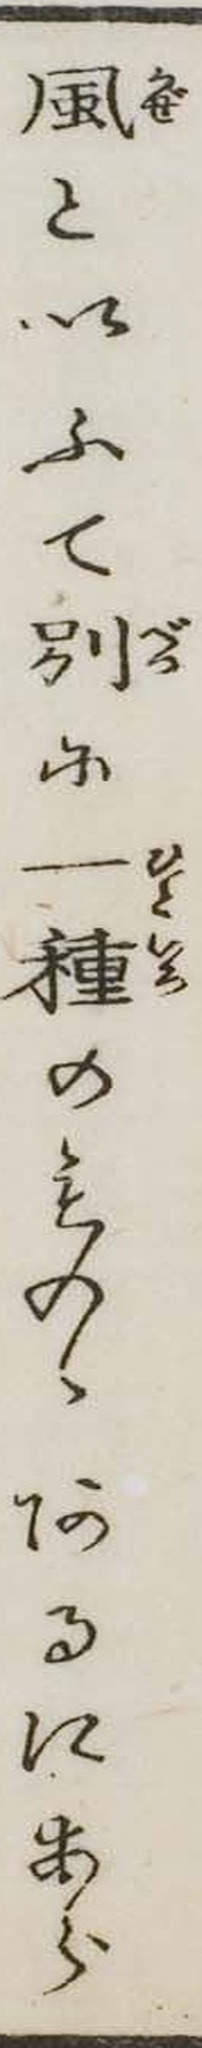風といふて別に一種のものゝあるにあら
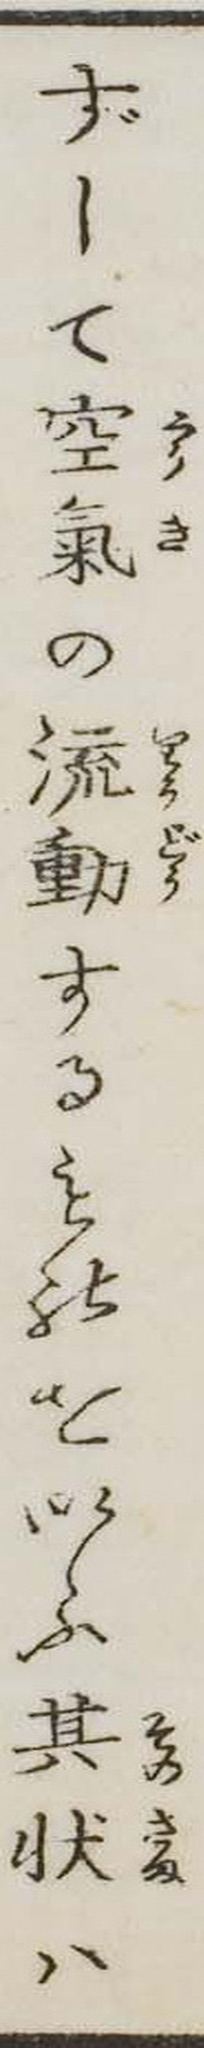ずして空氣の流動するものをいふ其状は
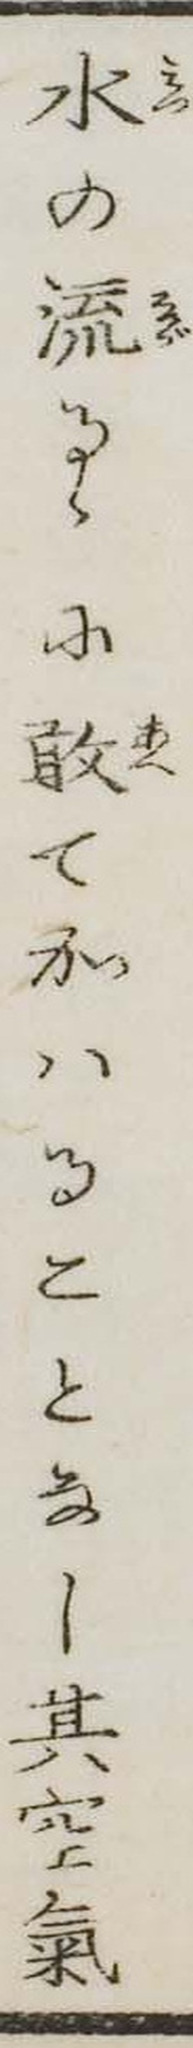水の流るゝに敢てかはることなし其空氣
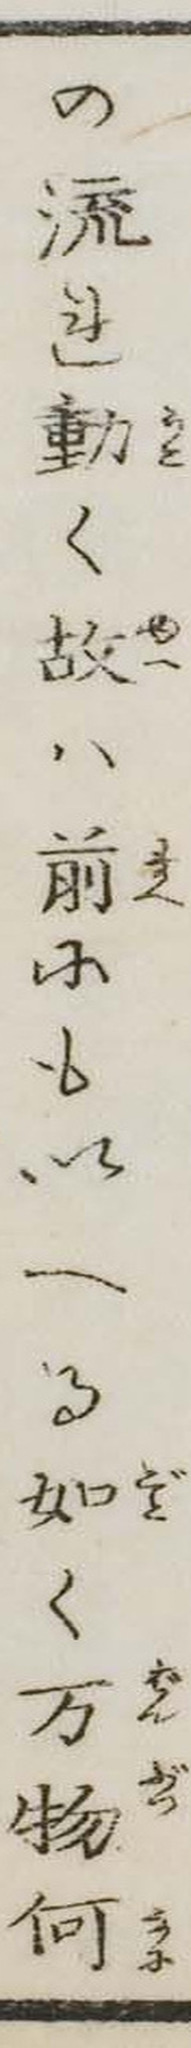の流れ動く故は前にもいへる如く万物何
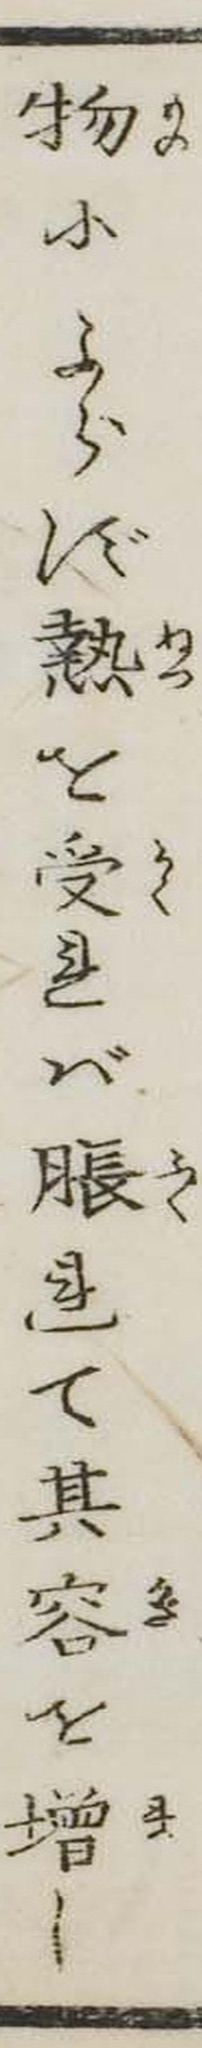物によらず熱を受れば脹れて其容を増し
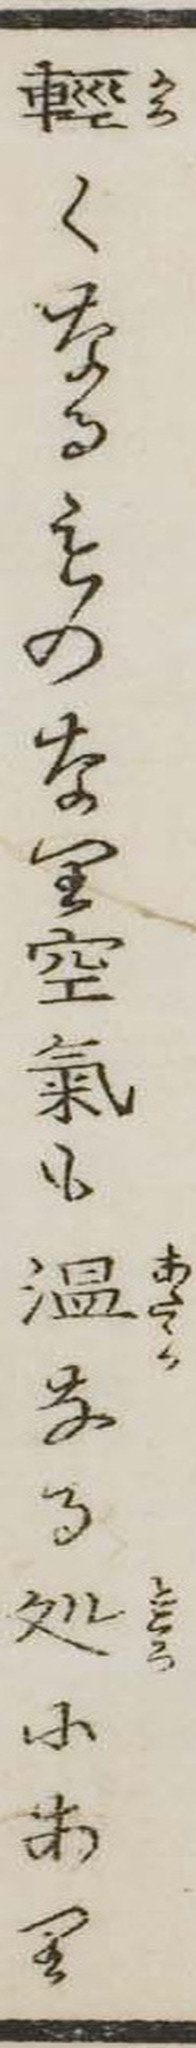輕くなるものなり空氣も温なる処にあり
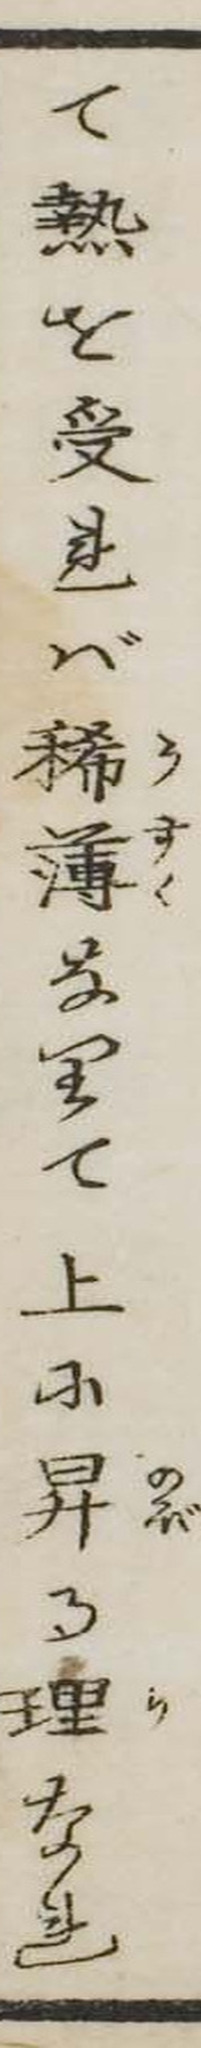て熱を受れば稀薄なりて上に昇る理なれ

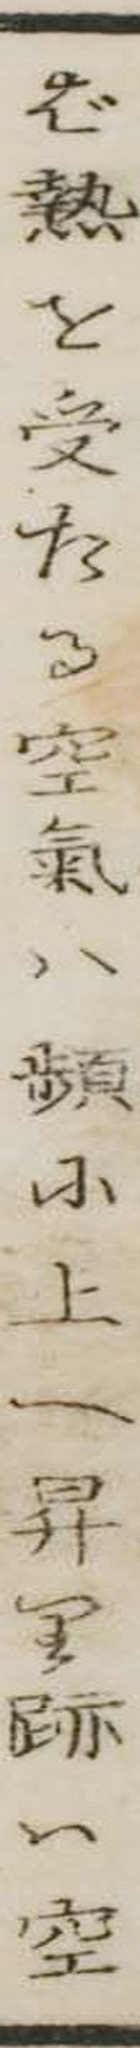ば熱を受たる空氣は頻に上へ昇り跡は空
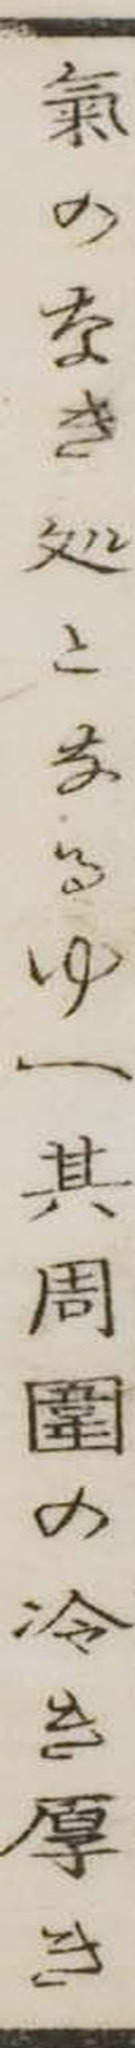氣のなき処となるゆへ其周圍の冷き厚き
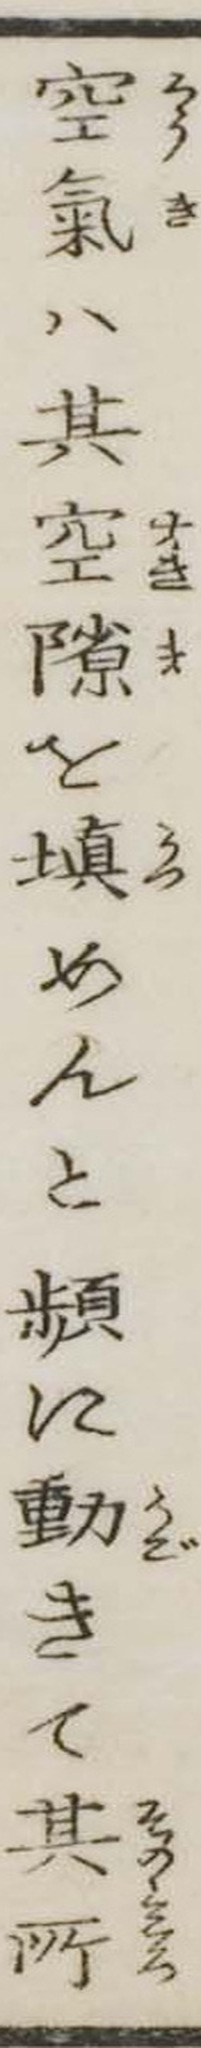空氣は其空隙を填めんと頻に動きて其所
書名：究理知慧の勧 : 訓蒙画入 巻之2
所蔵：東京学芸大学附属図書館
